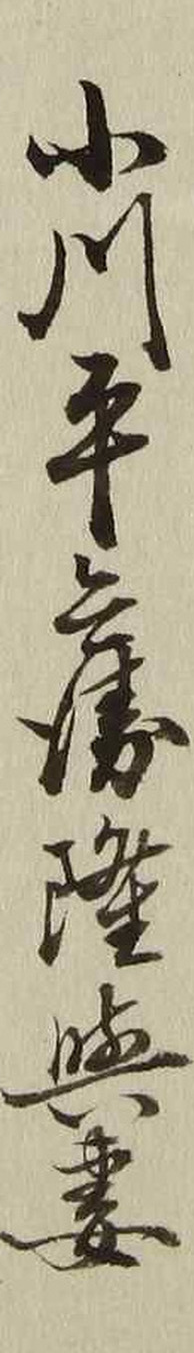女小川平兵衛陸與妻
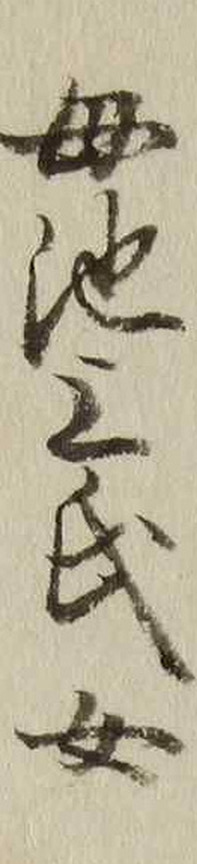母池上氏女
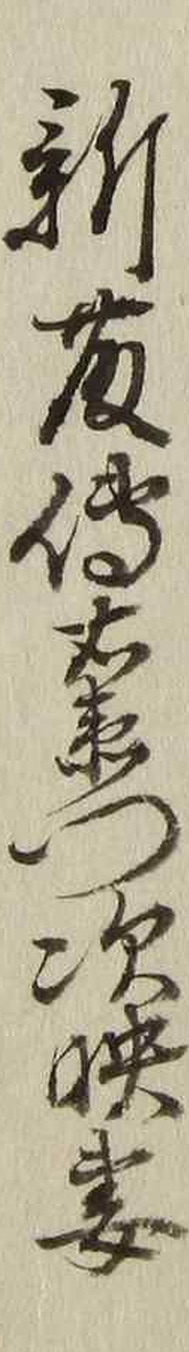新藤伝右衛門次映妻
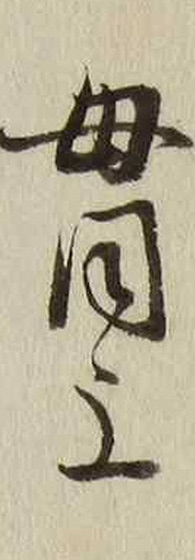母同上
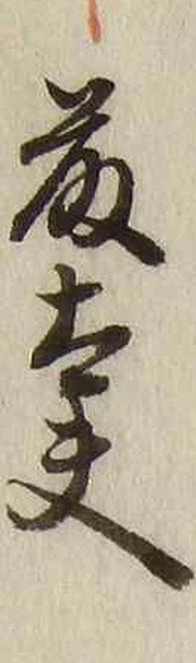藤太夫
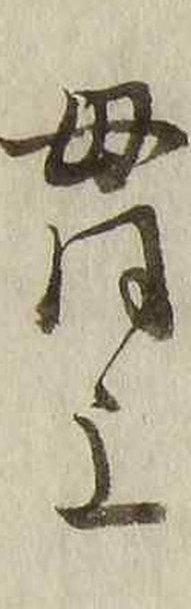母同上

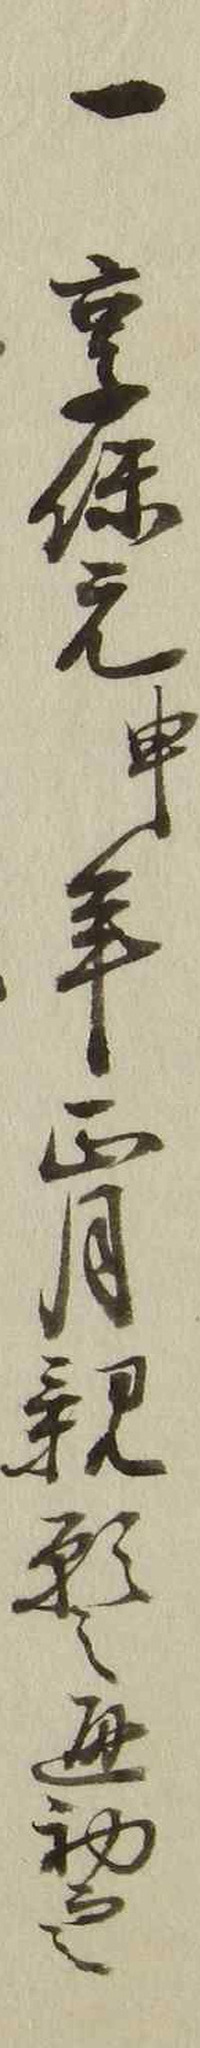一享保元申年正月親願之通初而之
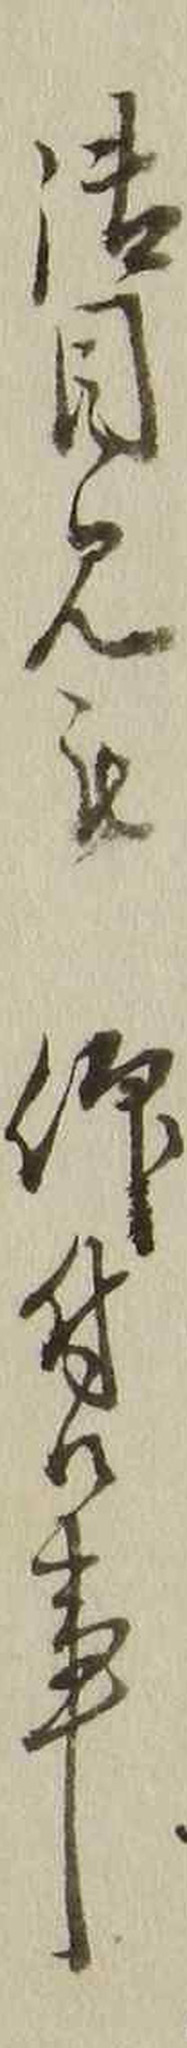御目見被仰付候事
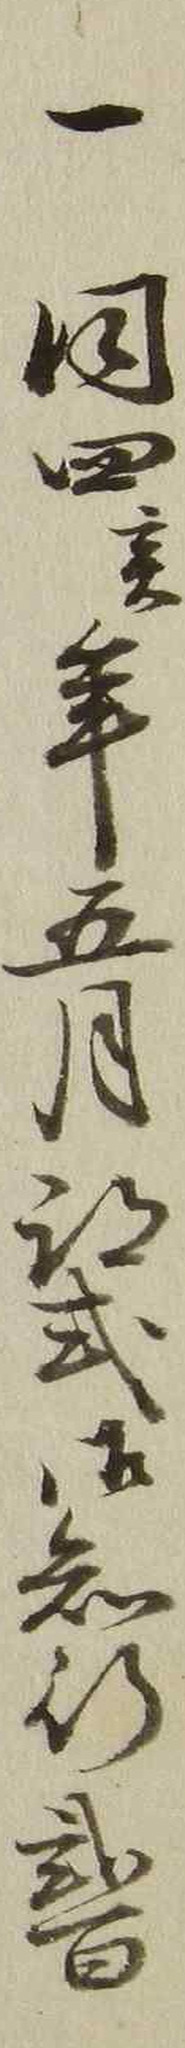一同四亥年五月跡式御知行弐百
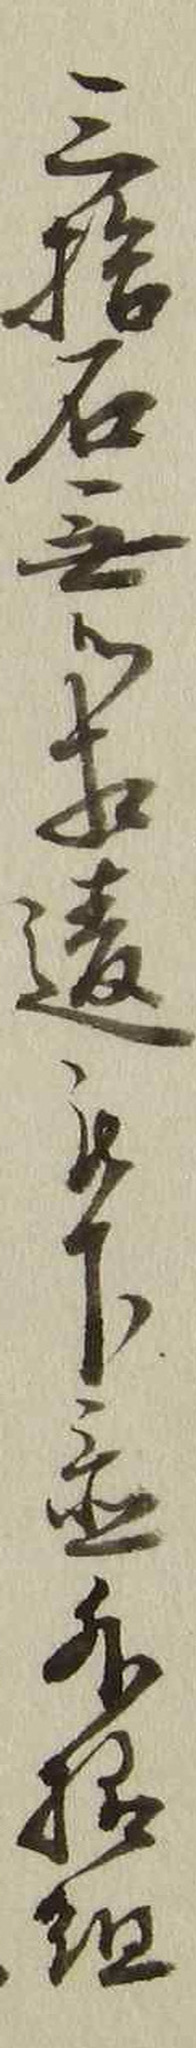三拾石無御相違被下置外様組
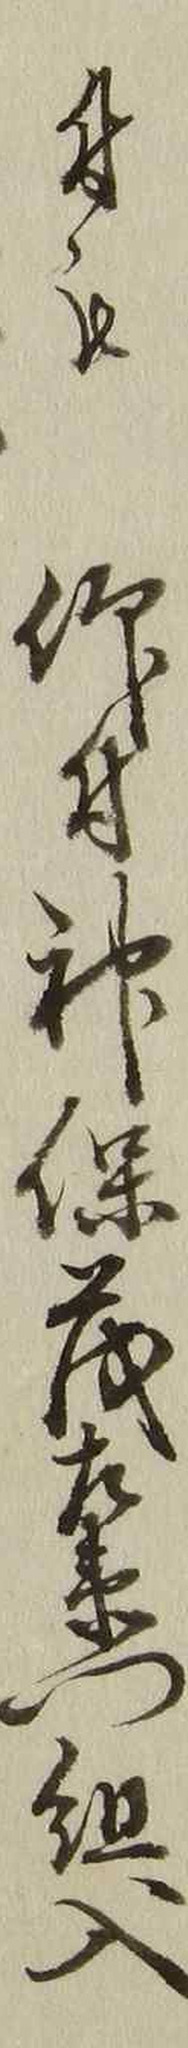付被仰付神保茂左衛門組へ入
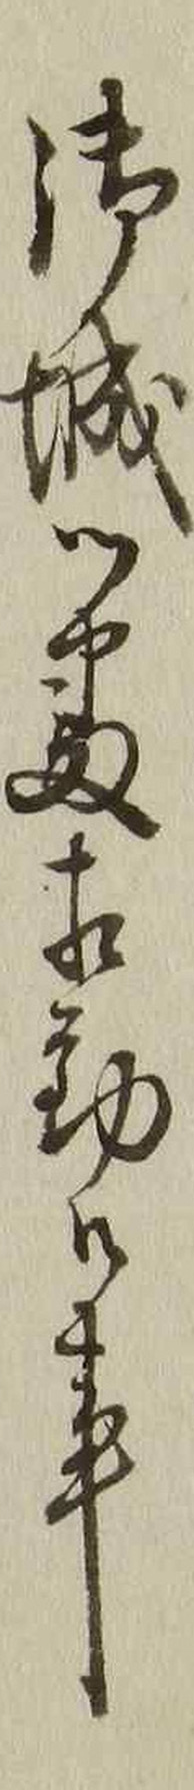御城御番相勤候事
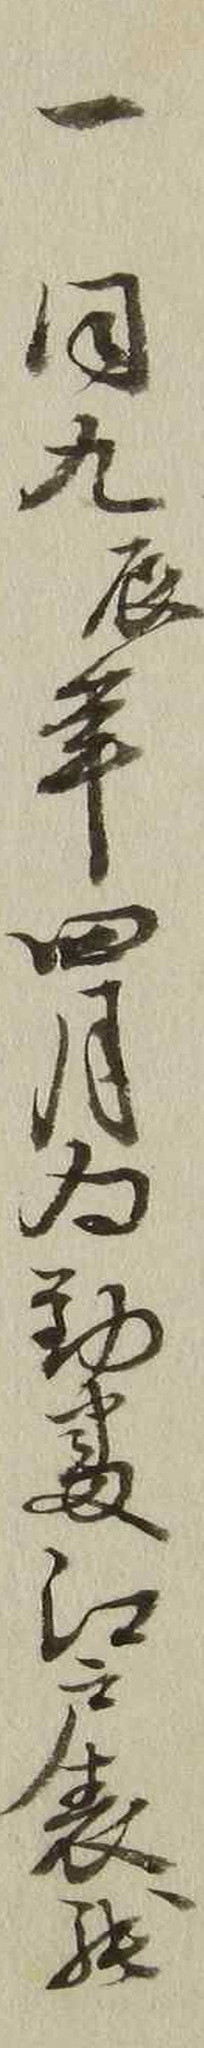一同九辰年四月為勤番江戸表へ罷
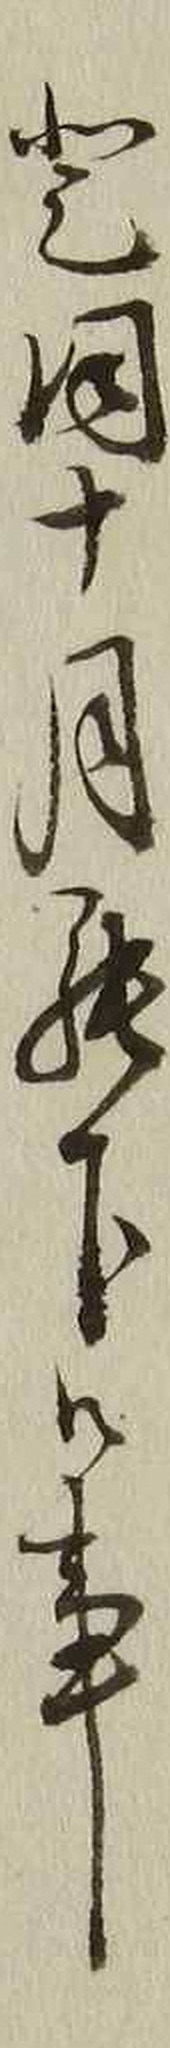登同十月罷下候事
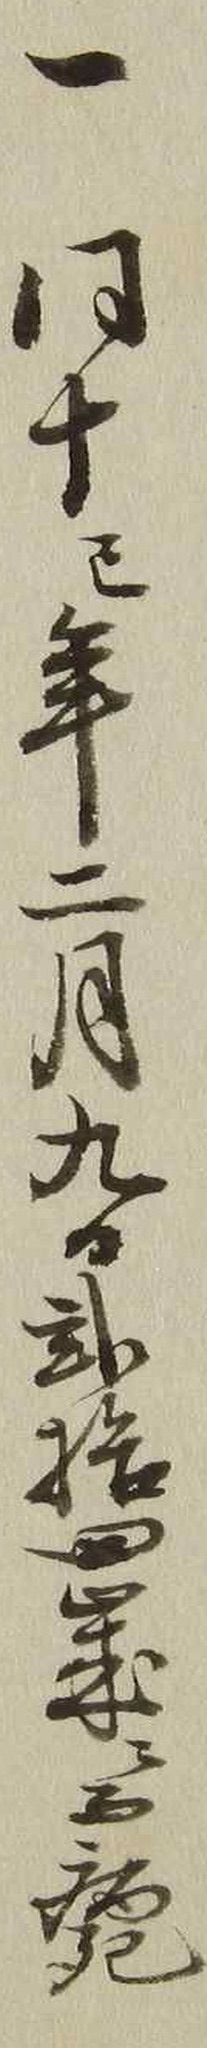一同十巳年二月九日弐拾四歳ニ而病死
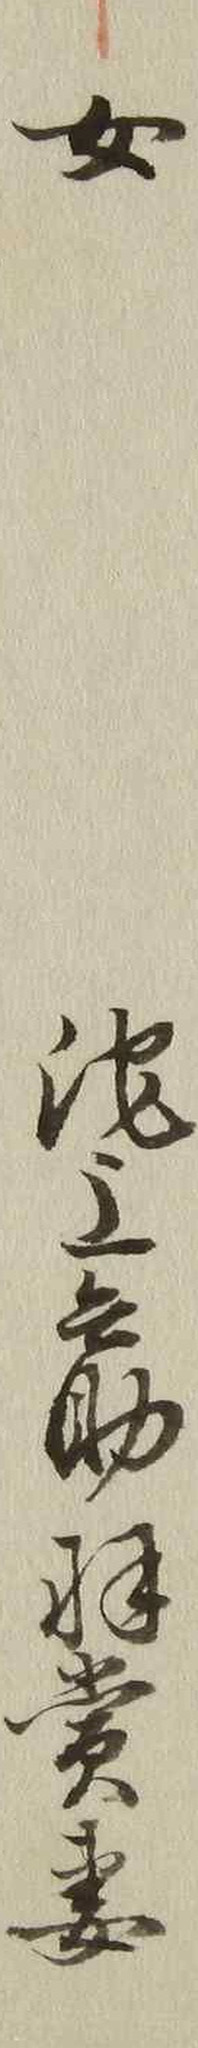女池上兵助羽賞妻
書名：諸士系譜　巻之31　い之部31
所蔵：会津若松市立会津図書館
